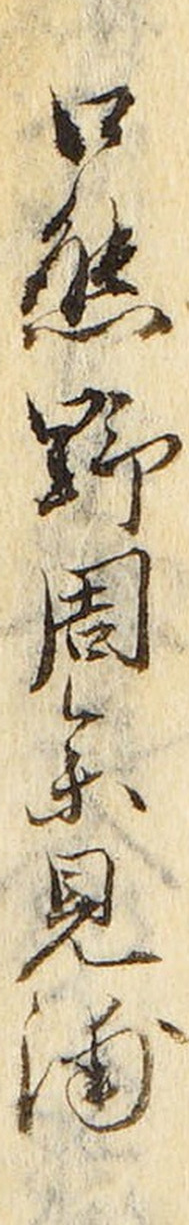口熊野周参見浦
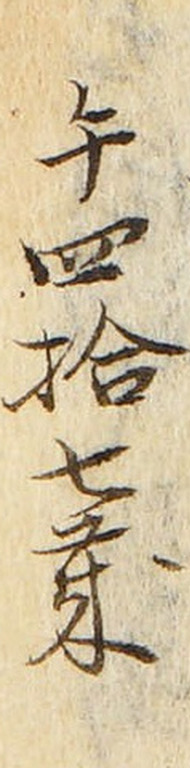午四拾七歳
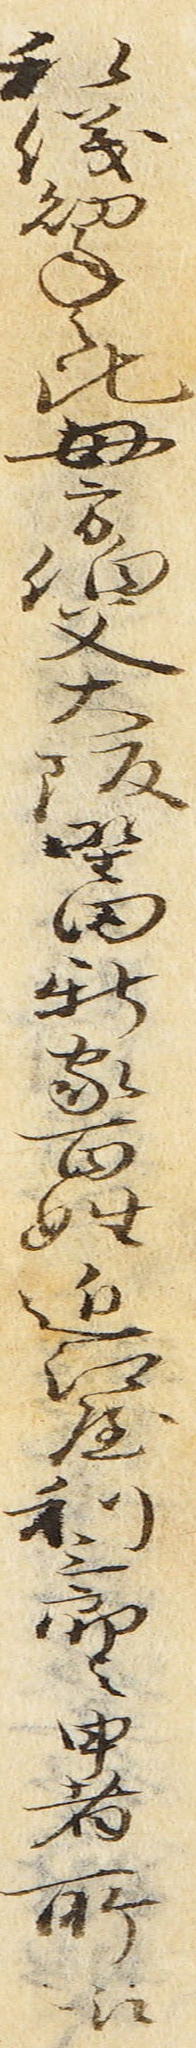私儀幼年之頃母方伯父大阪野田新家百姓近江屋利三郎与申者所江
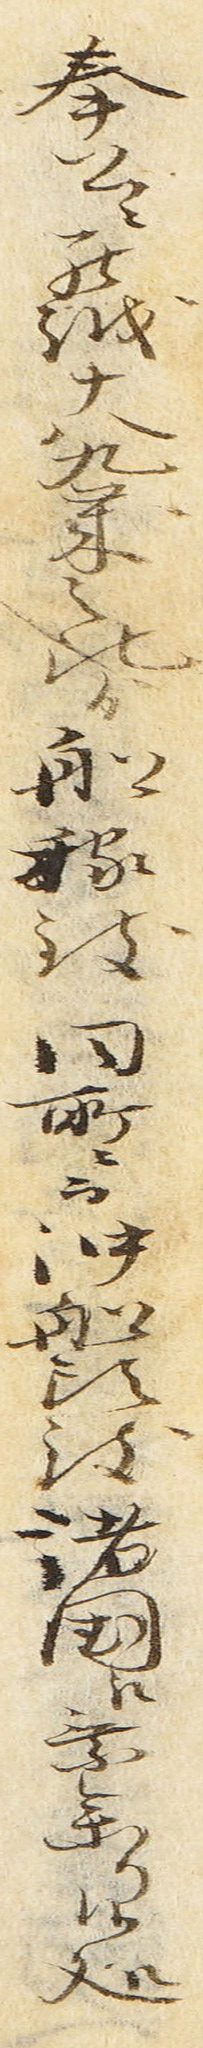奉公に罷越十八九歳之比ゟ船稼致同所に而沖船頭致諸国江乗参り候処
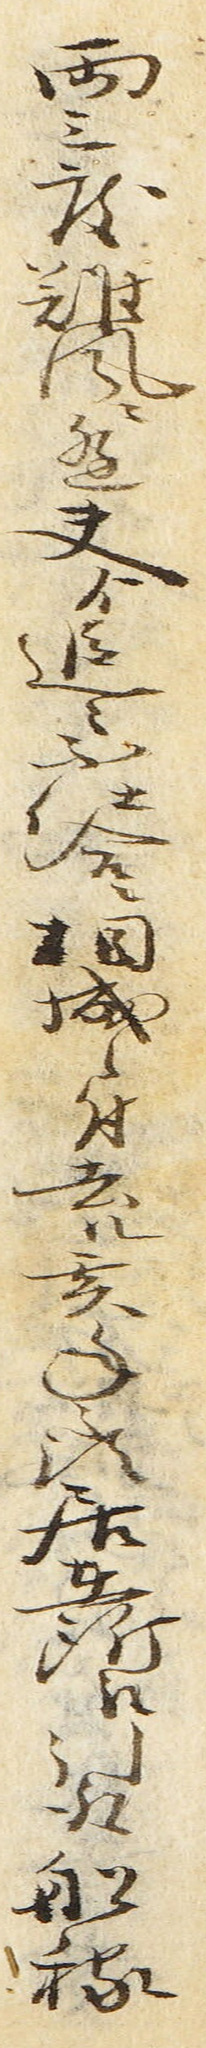両三度難風に逢夫ゟ追々不仕合に相成候付去る亥年之頃居在所江引取船稼
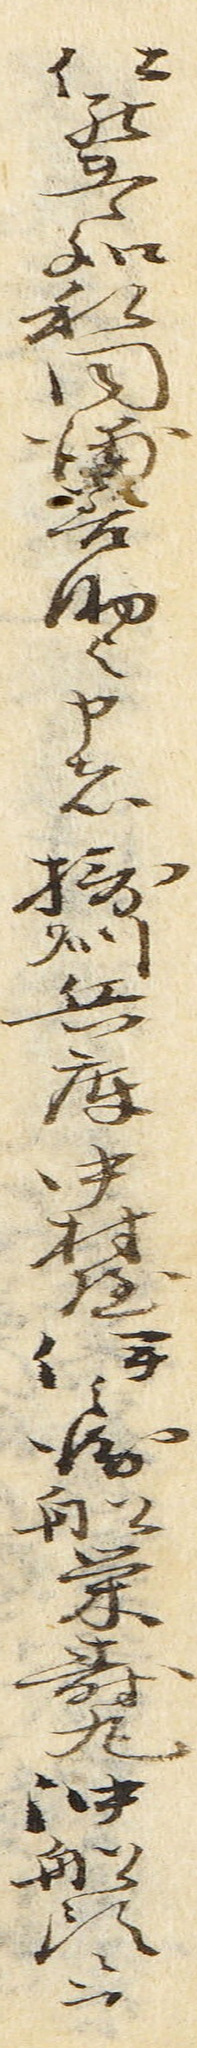仕罷在候処私同浦善助与申者摂州兵庫中村屋伊兵衛船栄寿丸沖船頭に而
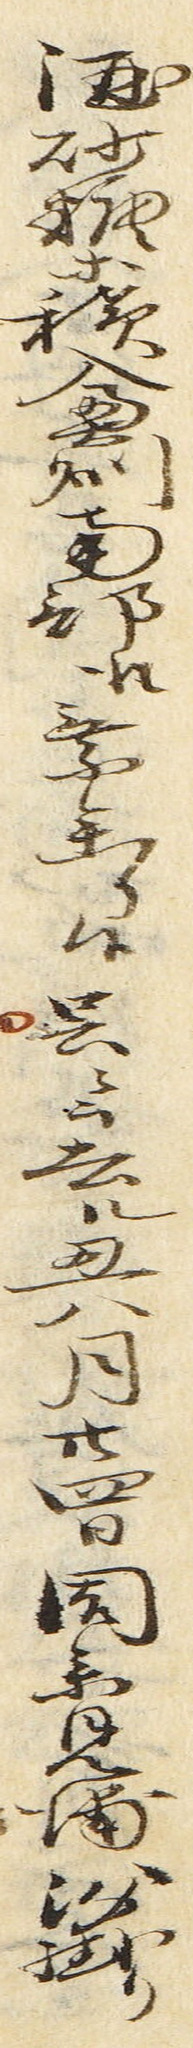酒砂糖等積入奥州南部江乗参り候呉に而去る丑八月廿四日周参見浦へ汐掛り
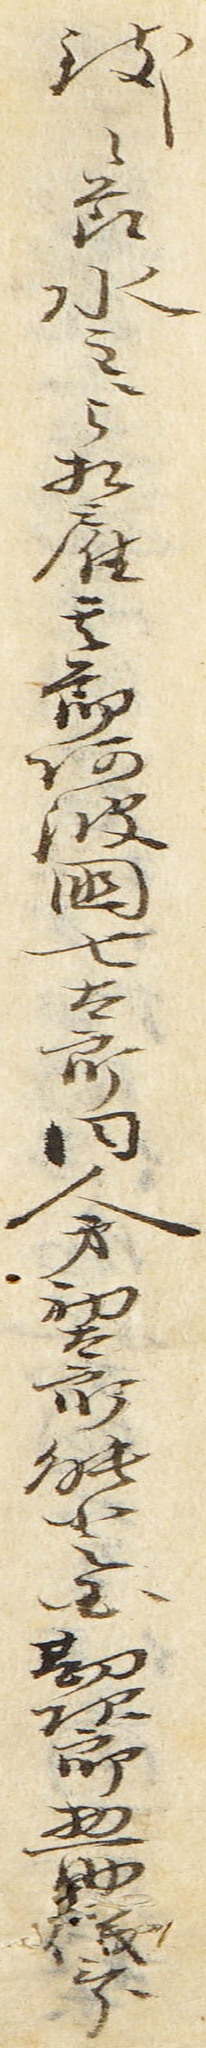致し候節水主に被相雇其節阿波国七太郎同人弟初太郎能登国勘次郎惣助儀三郎

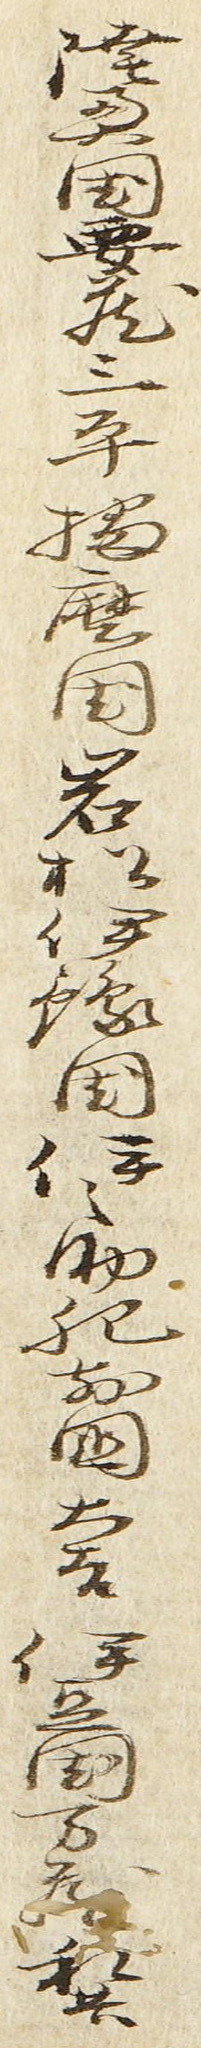陸奥国要蔵三平播磨国岩松伊予国伊之助肥前太吉伊豆国万蔵私共
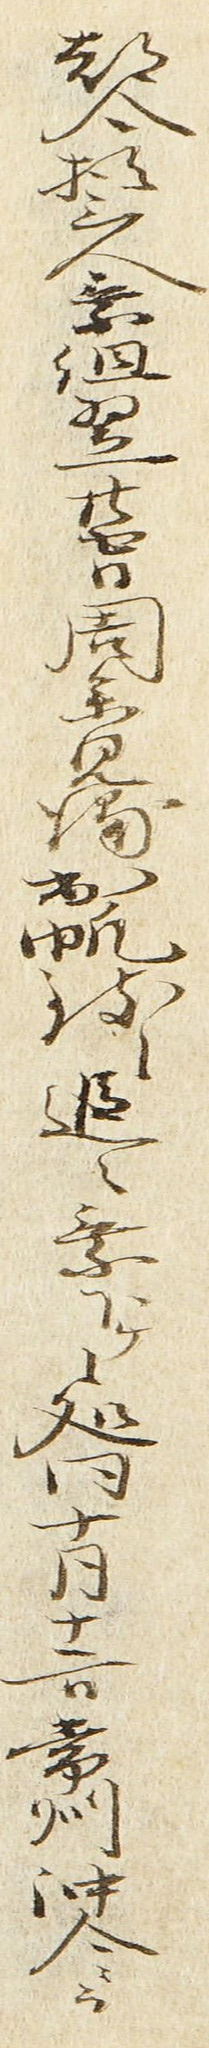都合拾三人乗組翌廿七日周参見浦出帆致し追々乗下ケ候処同十月十二日常州沖合に而
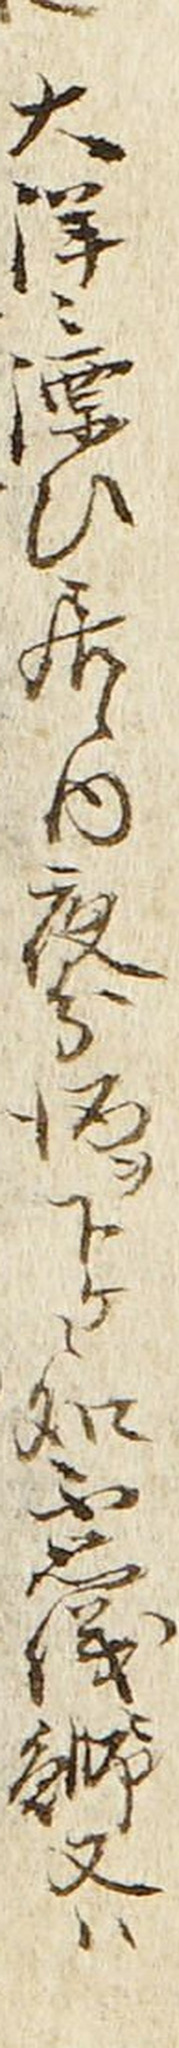二行文大洋に漂ひ居内夜分酒を下ケ候処不思議に鰤又ㇵ
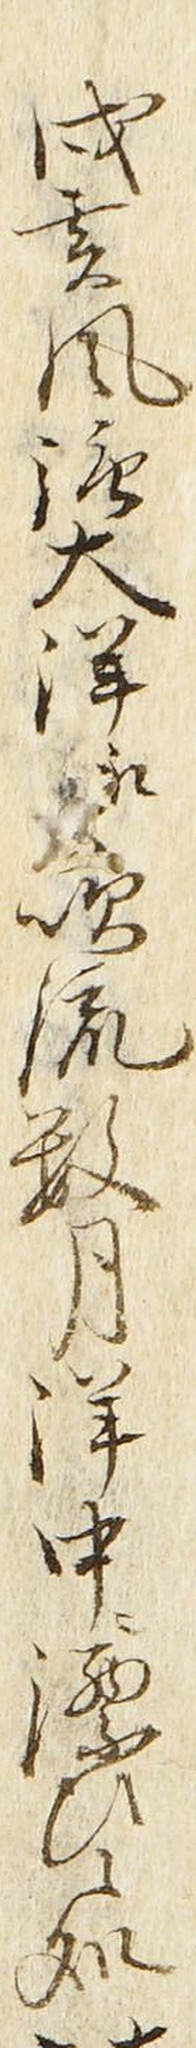戌亥風強大洋候吹流数月洋中に漂ひ候処
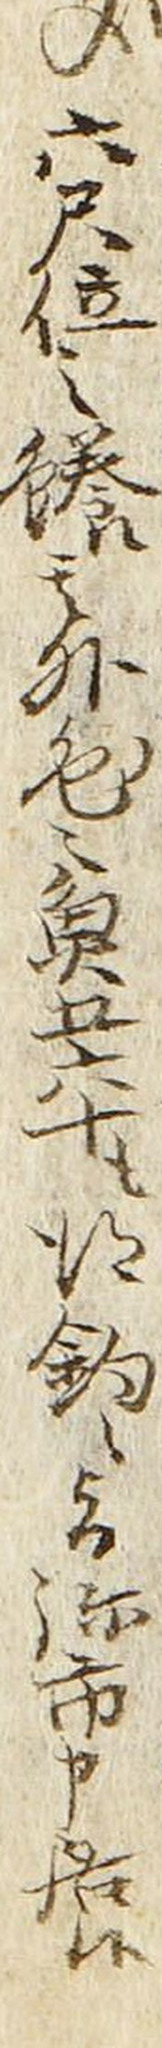六尺位之鱶其外色々魚五六十も得釣候旨弥市申居候
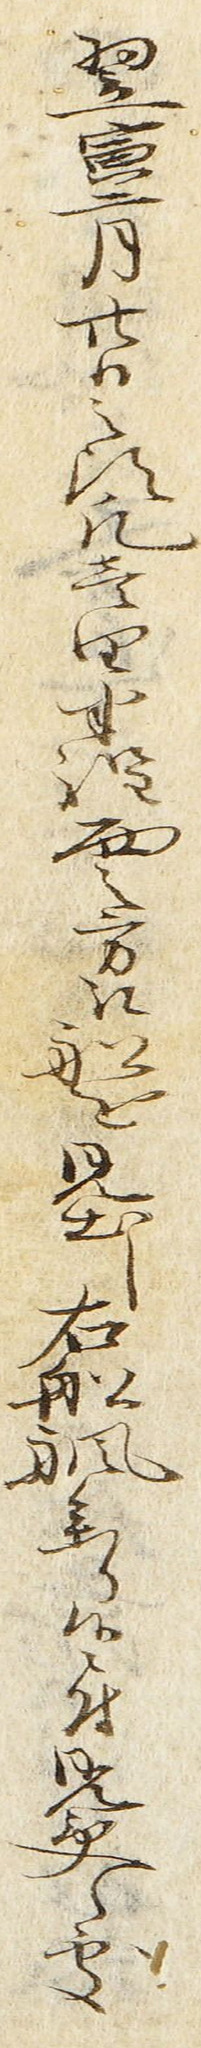翌寅二月は廿日頃凡壱里半程西之方江船を見出し右船䑺参り候に付見受候処
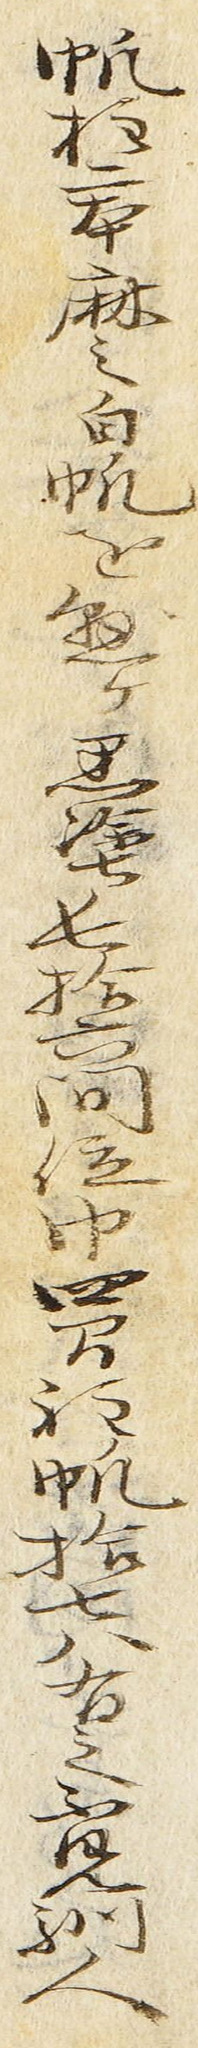帆柱二本麻之白帆を懸ケ黒塗七拾六間位巾四間程帆拾七八有之不見馴人
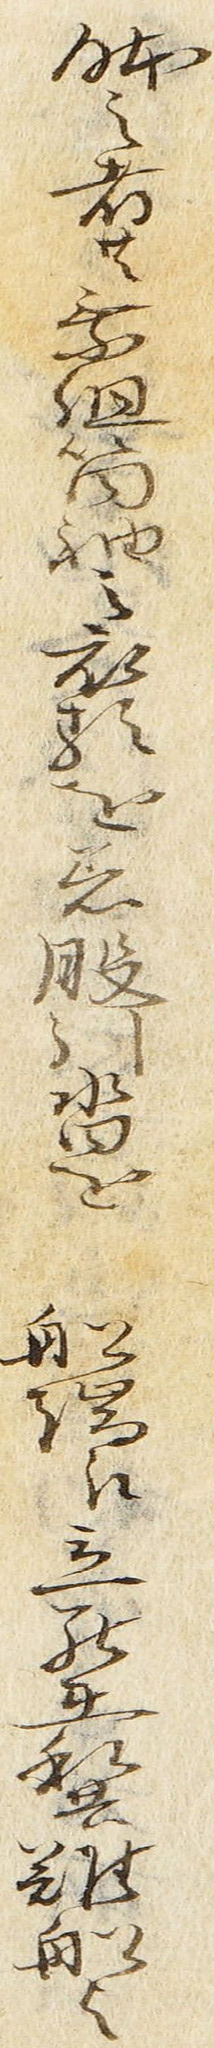躰之者共乗組筒袖之衣類を着股引沓を船端江立罷在私共難船と
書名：長崎漂流記
